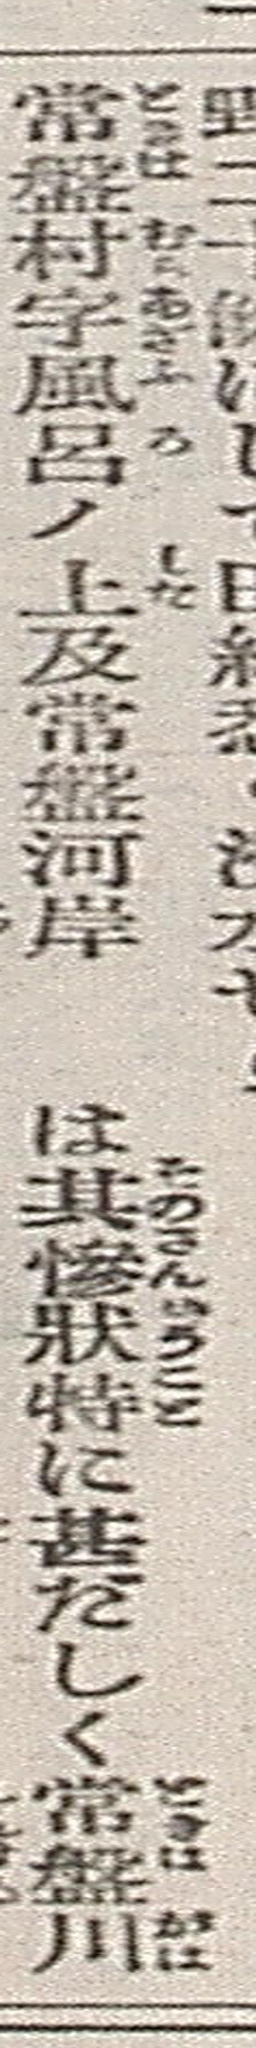常盤村字風呂ノ上及常盤河岸は其惨状殊に甚だしく常盤川
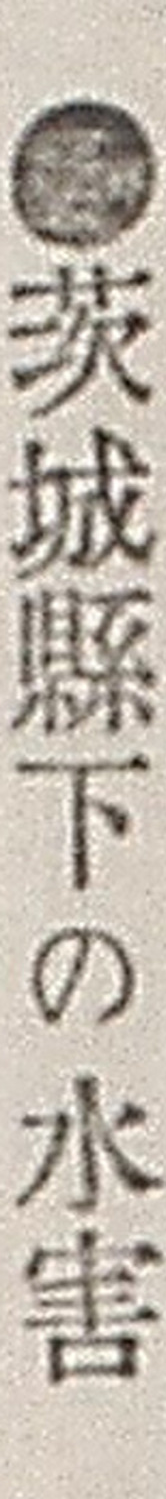●茨城県下の水害
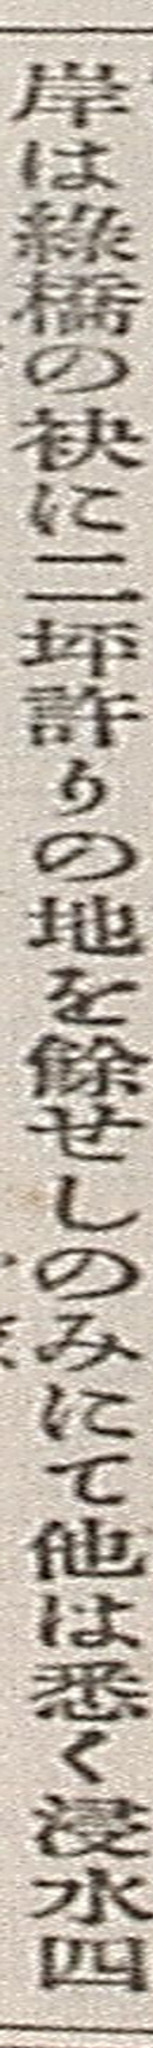岸は緑橋の袂に二坪許りの地を餘せしのみにて他は悉く浸水四
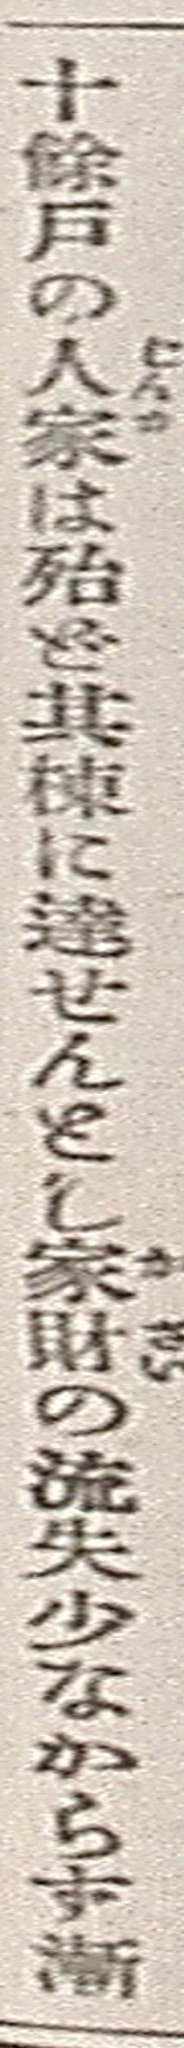十餘戸の人家は殆ど其棟に達せんとし家財の流失少なからず漸
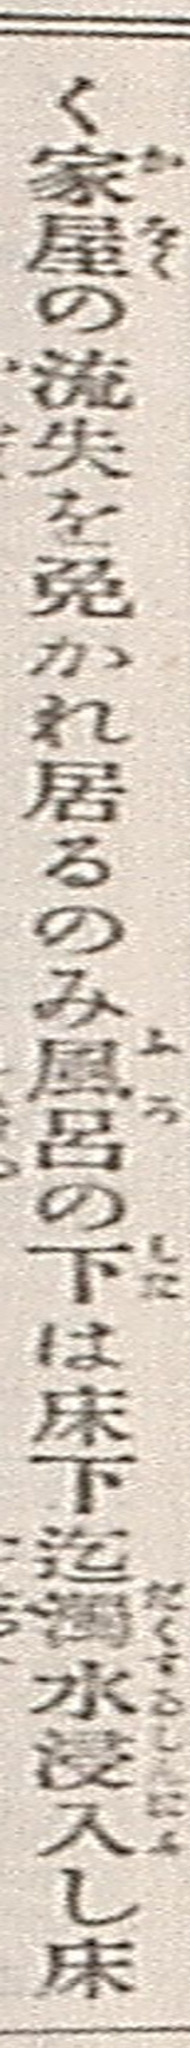く家屋の流失を免かれ居のみ風呂の下は床下迄濁水侵入し床
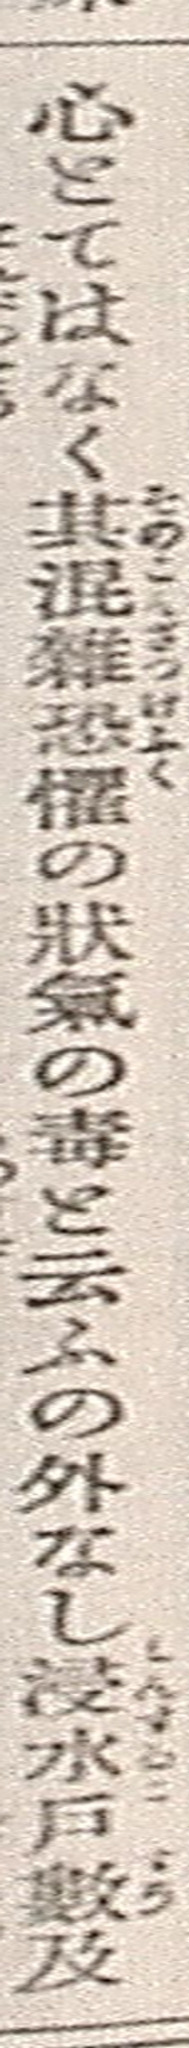心とてはなく其混雑恐懼の状気の毒と云ふの外なし浸水戸数及
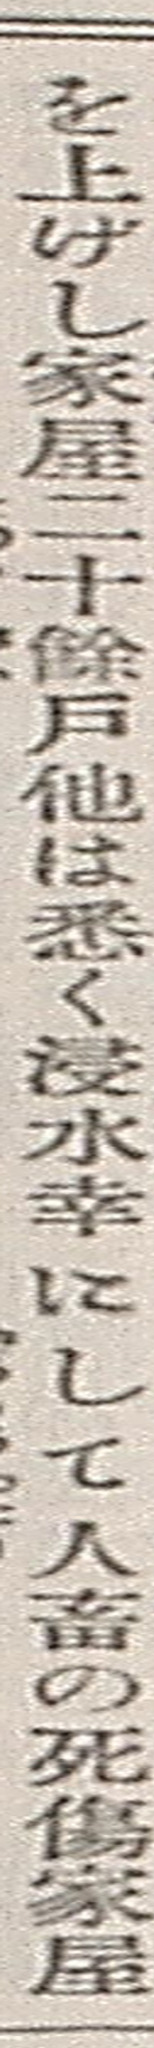を上げし家屋二十餘戸他は悉く浸水幸にして人畜の死傷家屋
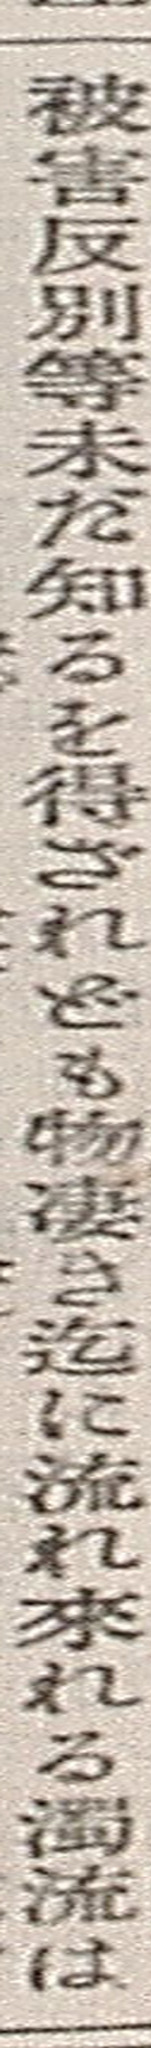被害反別等未だ知るを得ざれども物凄き迄に流れ来れる濁流は
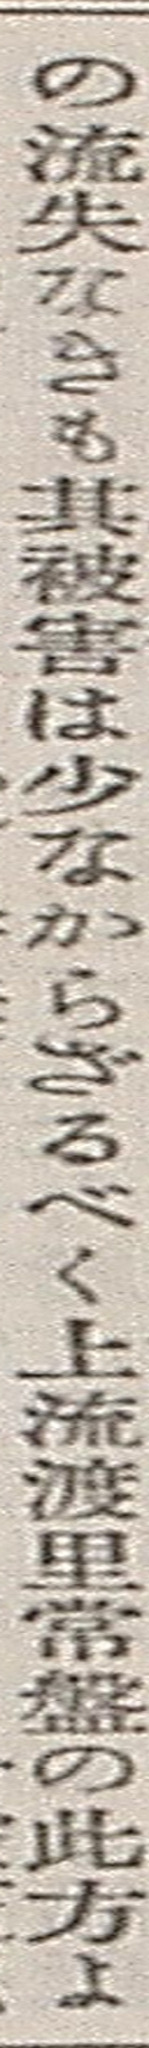の流失なきも其被害は少なからざるべく上流渡里常盤の此方よ
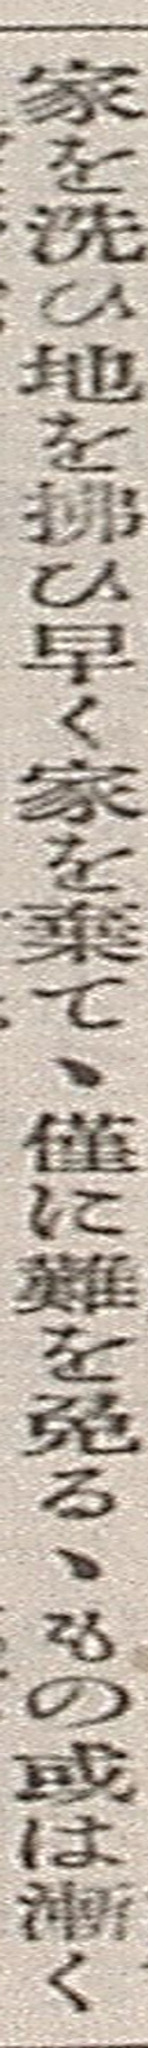家を洗ひ地を払ひ早く家を棄てゝ僅に難を免るゝもの或は漸く
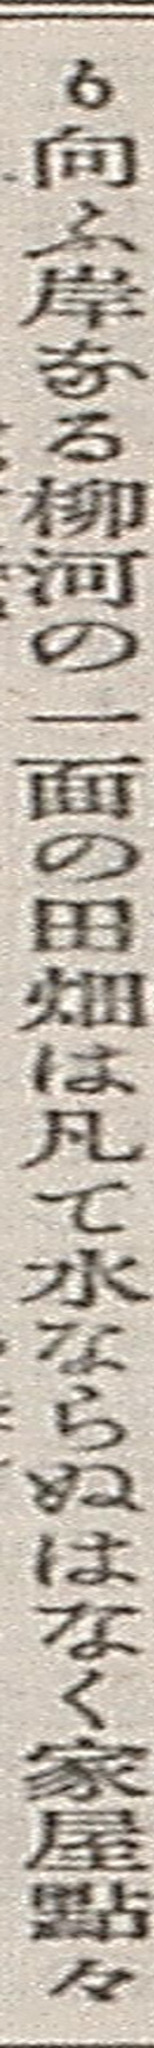り向ふ岸なる柳河の一面の田畑は凡て水ならぬはなく家屋点々
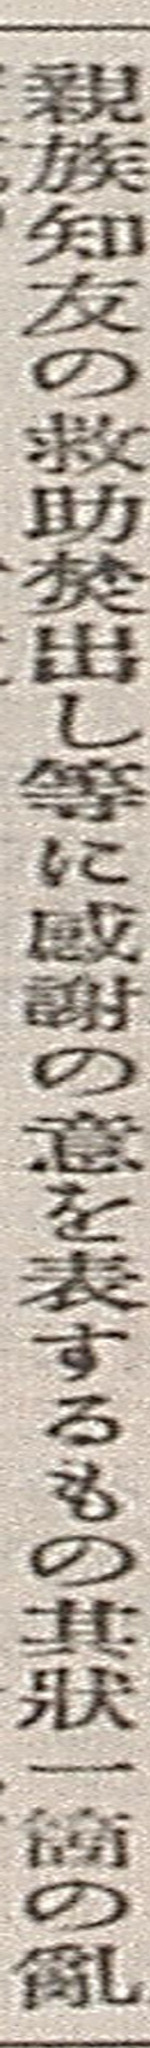親族知友の救助焚出し等に感謝の意を表するもの其状一箇の乱
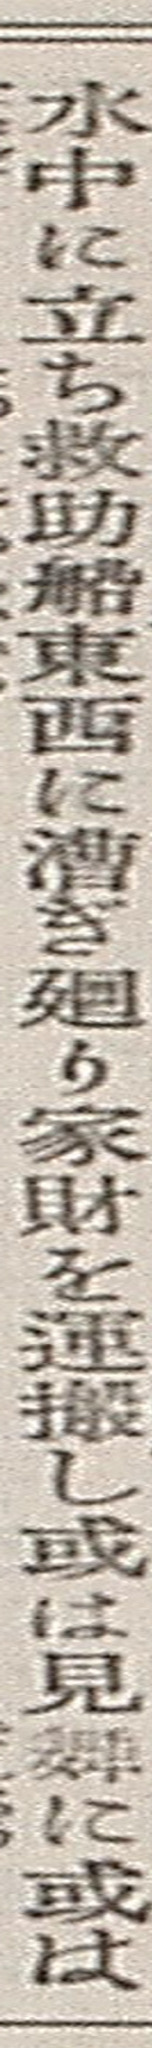水中に立ち救助船東西に漕ぎ廻り家財を運搬し或は見舞に或は
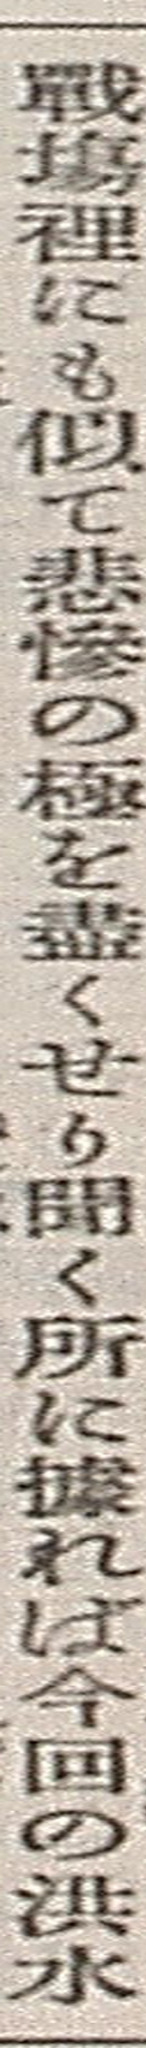戦場裡にも似て悲惨の極を尽くせり聞く所に據れば今回の洪水
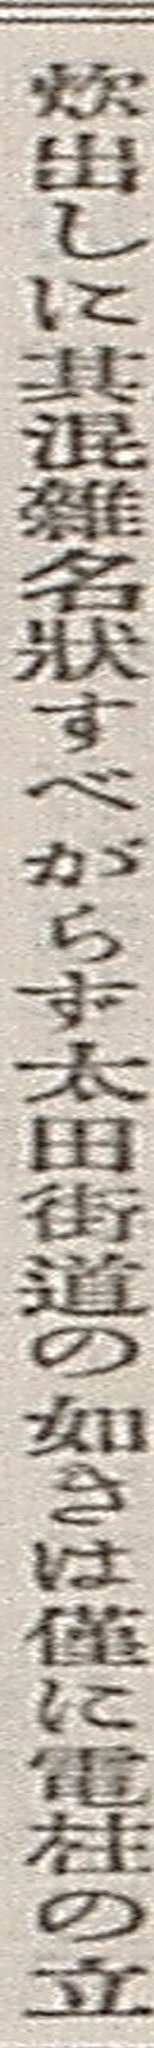焚出しに其混雑名状すべからず太田街道の如きは僅に電柱の立
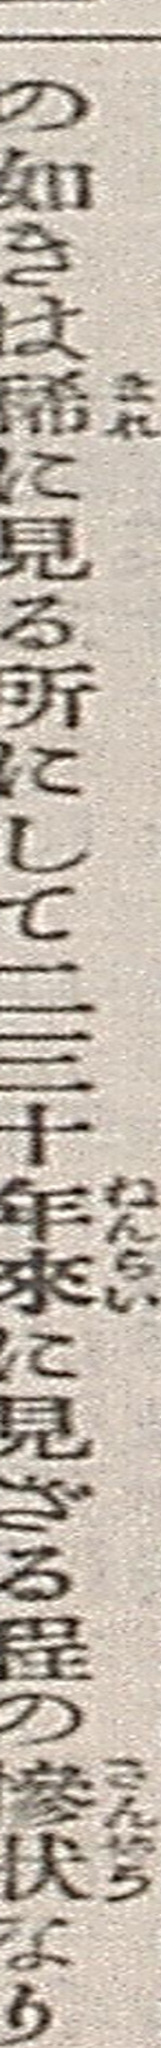の如きは稀に見る所にして二三十年来に見ざる程の惨状なりと
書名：風俗畫報臨時増刊第百二十八號　洪水被害録（下）
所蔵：東京大学地震研究所図書室 Earthquake Research Institute Library, The University of Tokyo, JAPAN
